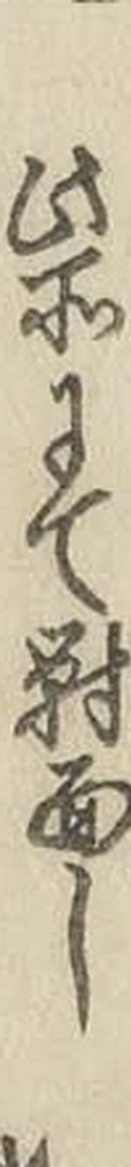此所にて対面し
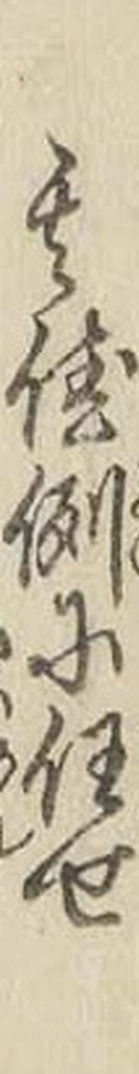其佳例に任せ
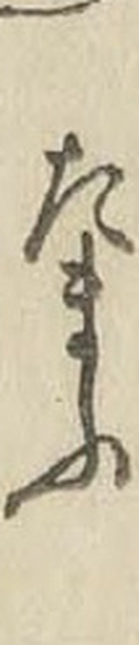たまふ
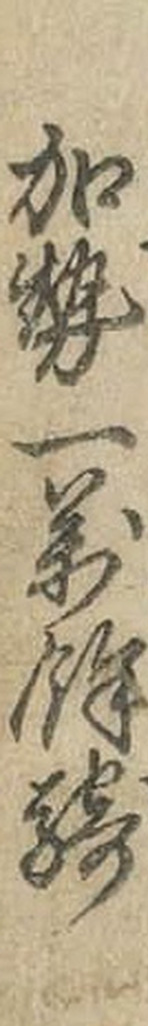加勢一万余騎

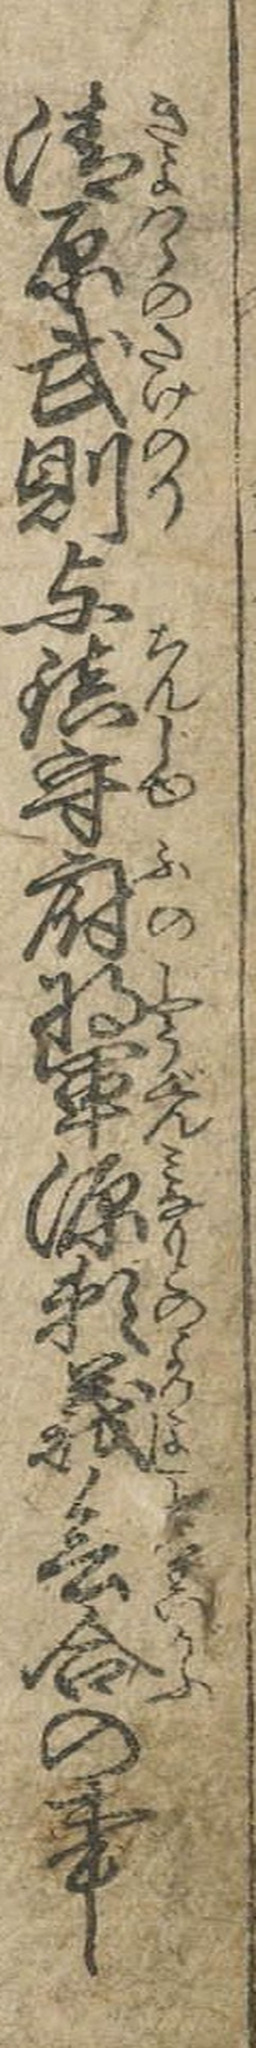清原武則与鎮守府将軍源頼義会合の事
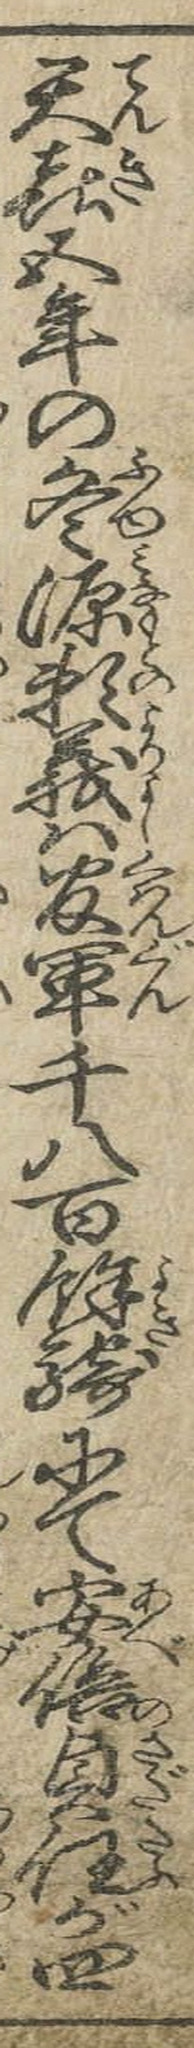天喜五年の冬源頼義は官軍千八百余騎にて安倍貞任が四
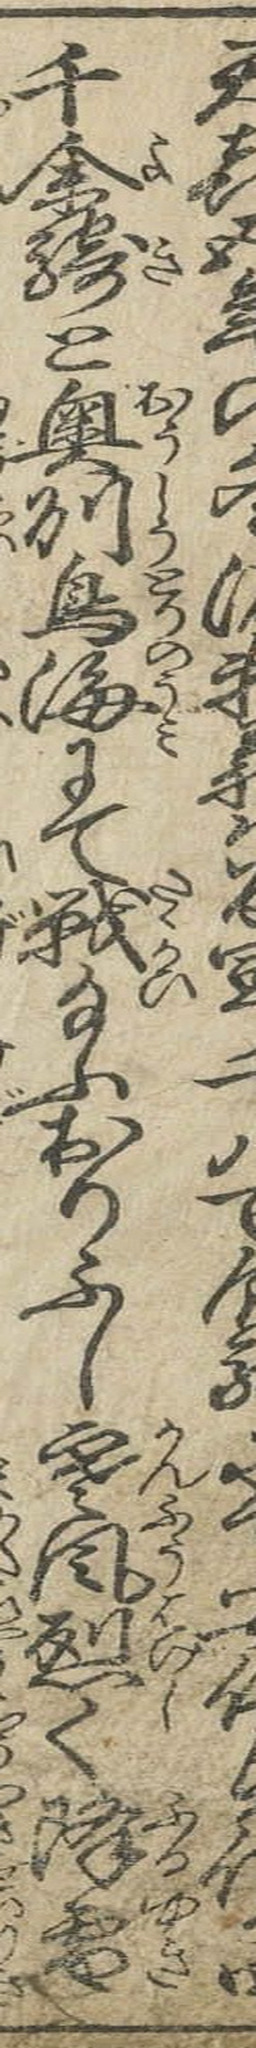千余騎と奥州鳥海にて戦給ふおりふし寒風烈く降雪
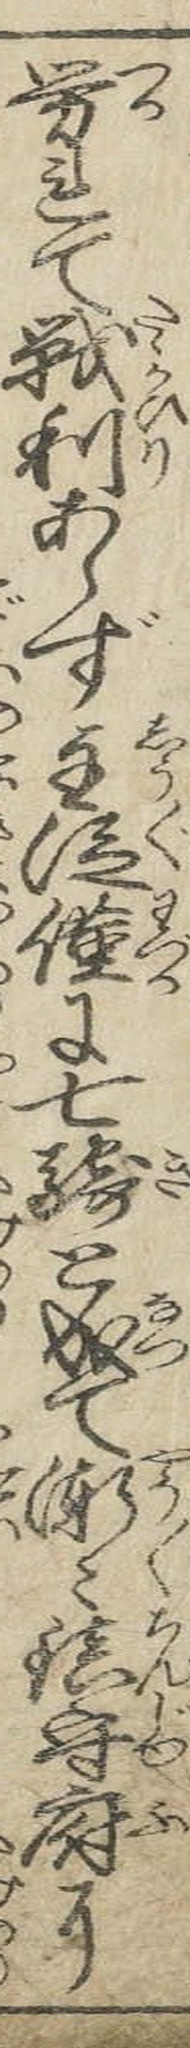労れて戦利あらず主従僅に七騎と成て漸々鎮守府に
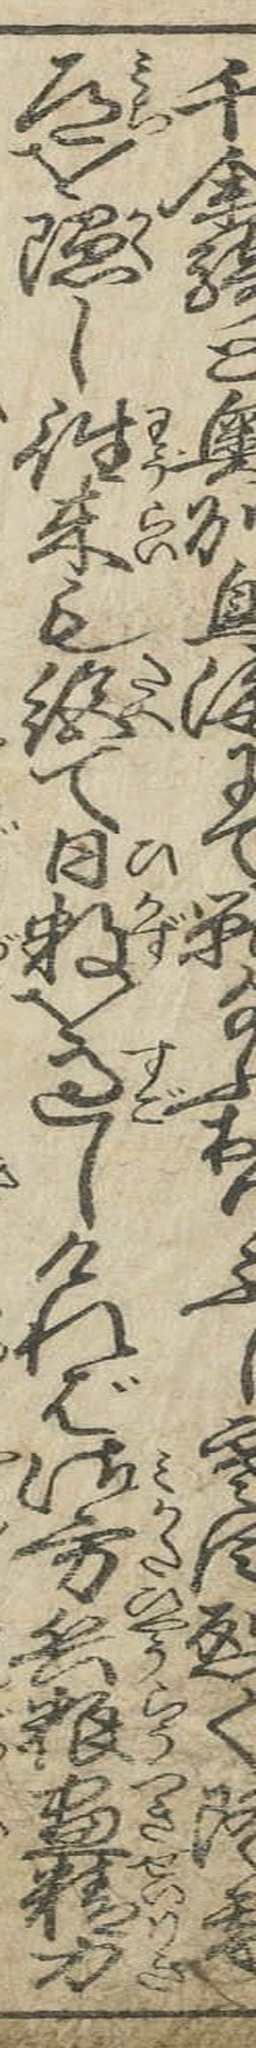道を隠し往来も絶て日数を過しければ御方兵粮尽精力
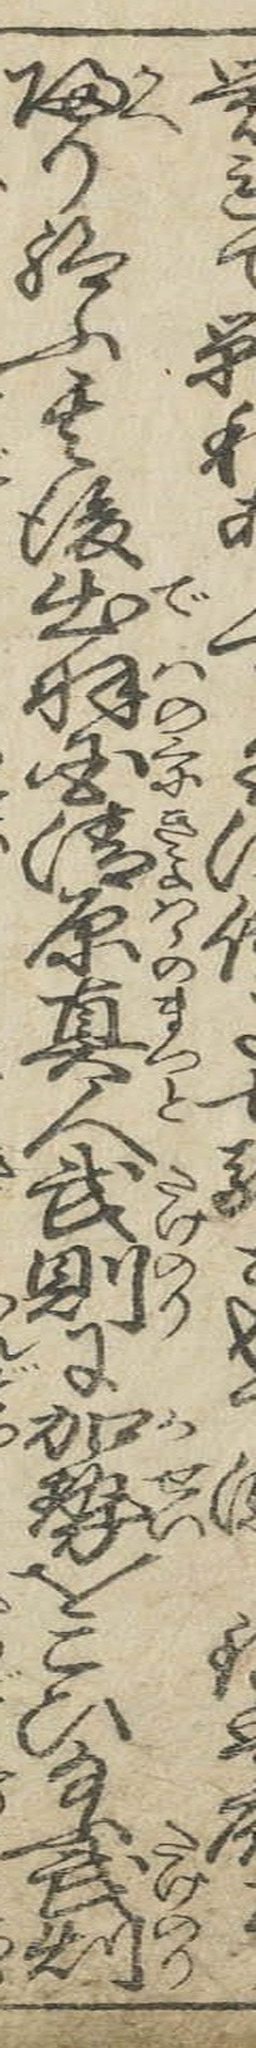帰り給ふ其後出羽国清原真人武則に加勢をこひ給ふ武則
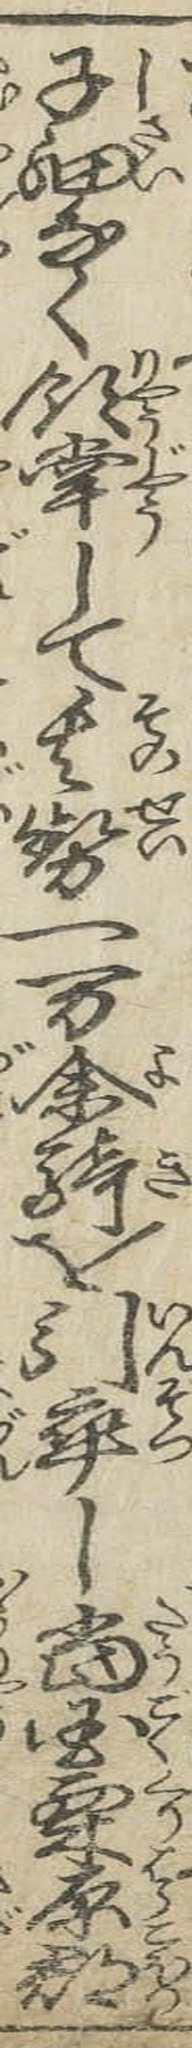子細なく領掌して其勢一万余騎を引率し当国栗原郡
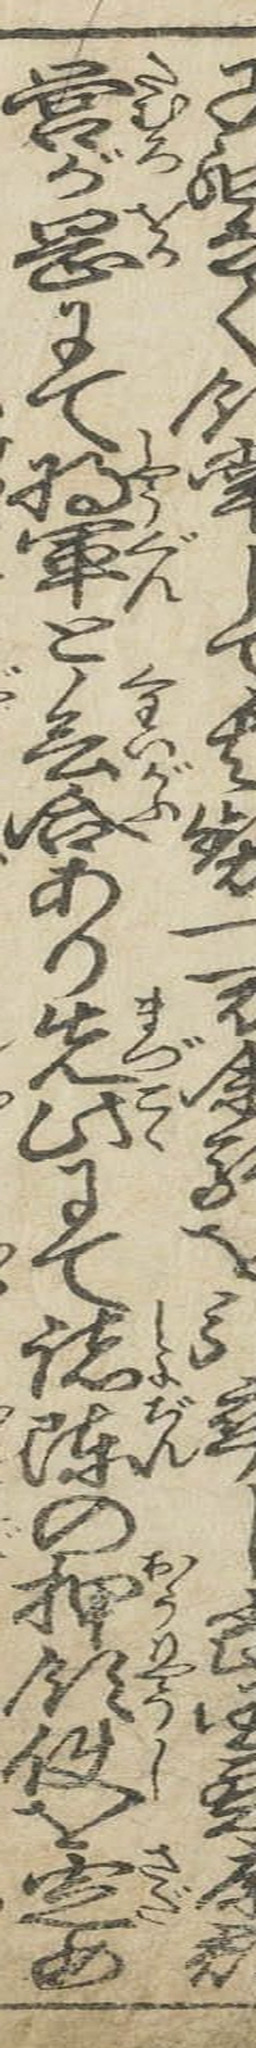営が岡にて将軍と会合あり先此にて諸陣の押領使を定め
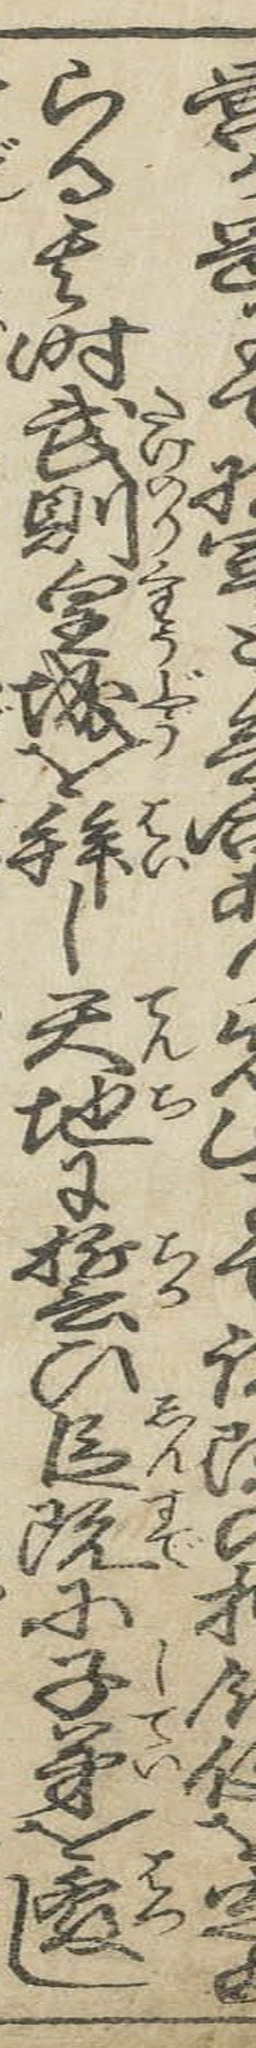らる其時武則皇城を拝し天地に誓ひ臣既に子弟を発し
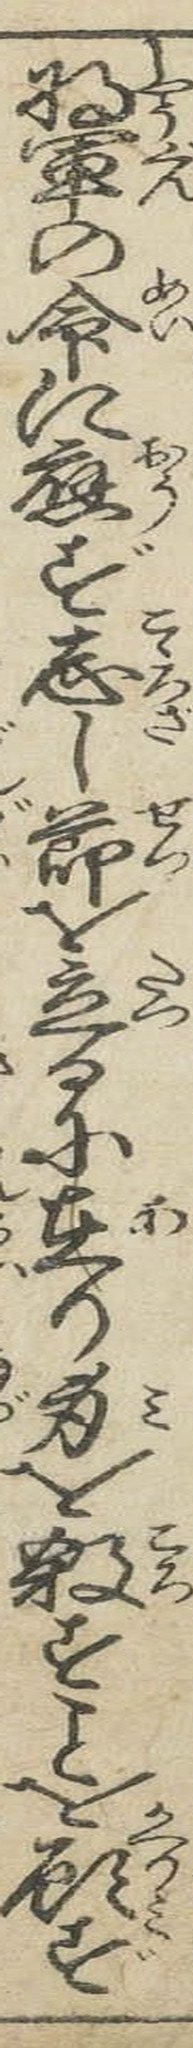将軍の命に応ず志し節を立るに在り身を殺すことを顧ず
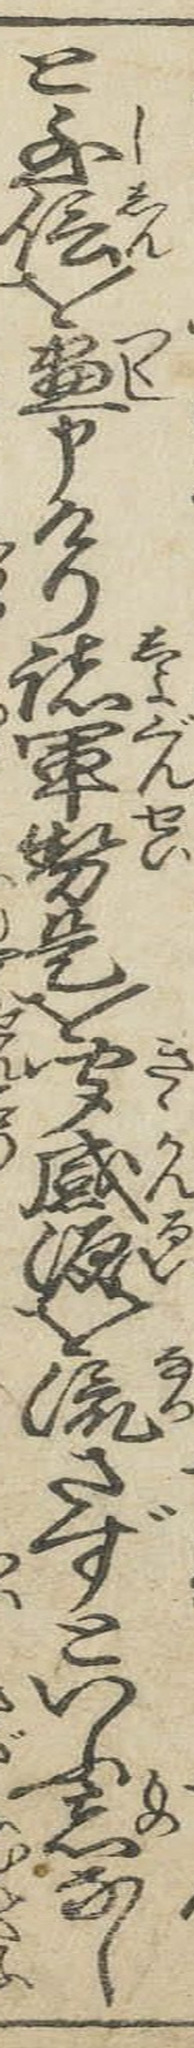と至信を尽申けり諸軍勢是を聞感涙を流さずといふ者なし
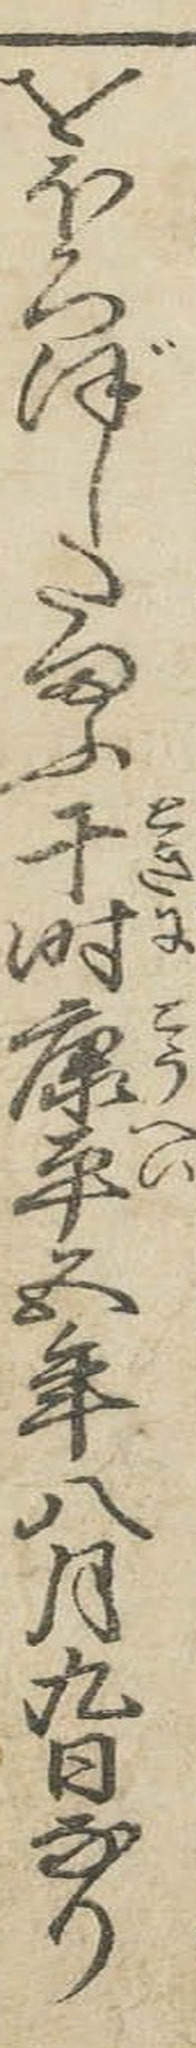をほろぼしたまふ于時康平五年八月九日なり終
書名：絵本写宝袋 9巻 2之巻
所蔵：東京学芸大学教育コンテンツアーカイブ
